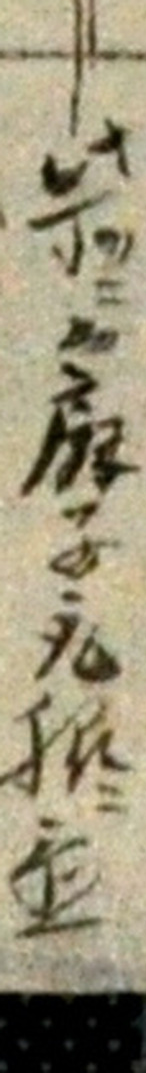此所ニ而扇子取脇ニ置

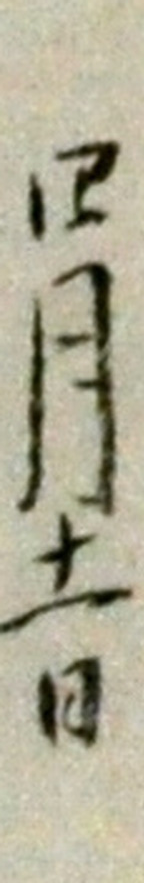四月十一日
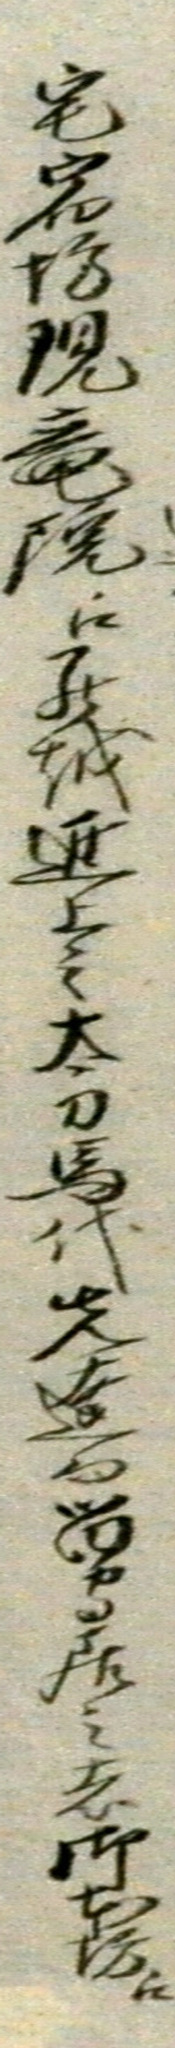宅宿坊現竜院え罷越進上之太刀馬代先達而留守居之者御本坊え
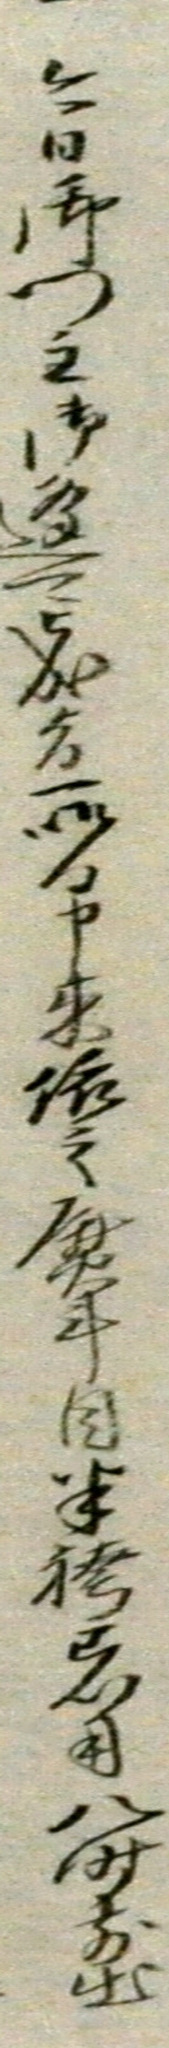一今日御門主御可被成旨一昨日申来依之熨斗目半袴着用八時前出
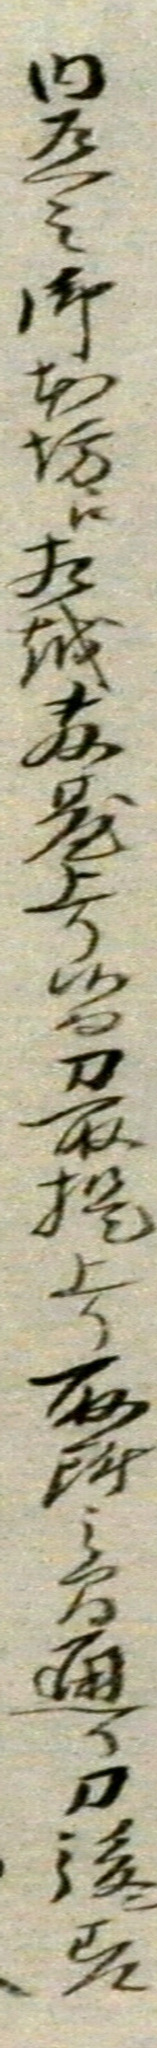内有之御本坊え相越敷台上り候而刀取提上り取附之間通り刀後ニ差
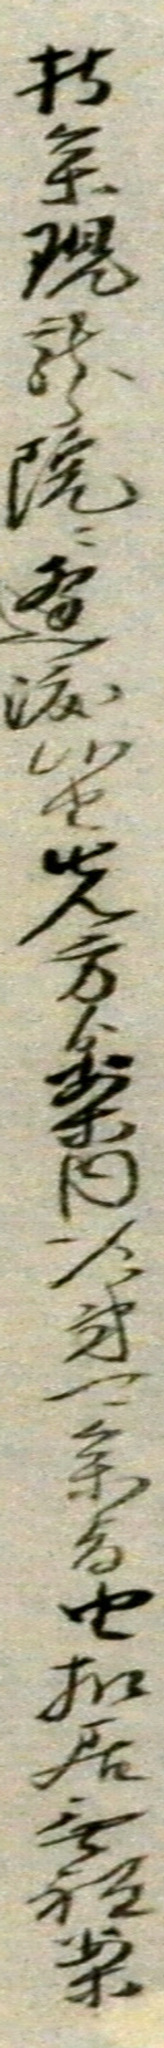持参現龍院ニ逢渡候由先方ゟ案内次第可参旨由扣居無程案
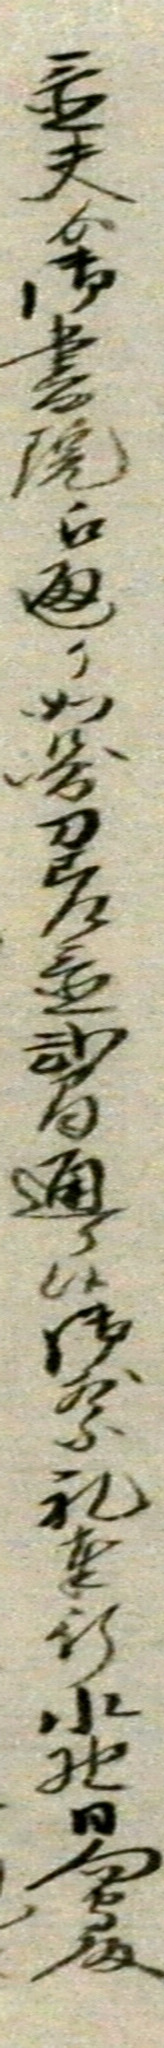置夫ゟ御書院え通り如図刀差置式目通り候御祭礼奉行水野日向守殿
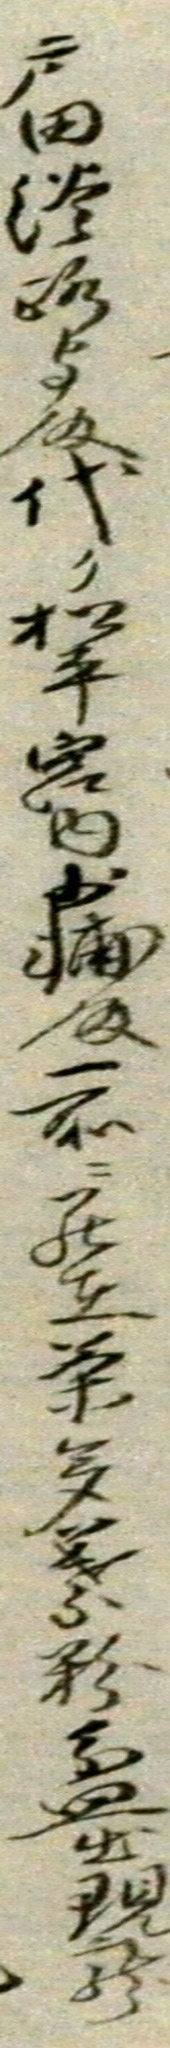戸田淡路守殿代り松平宮内少輔殿一所ニ罷在茶多葉粉盆出現龍
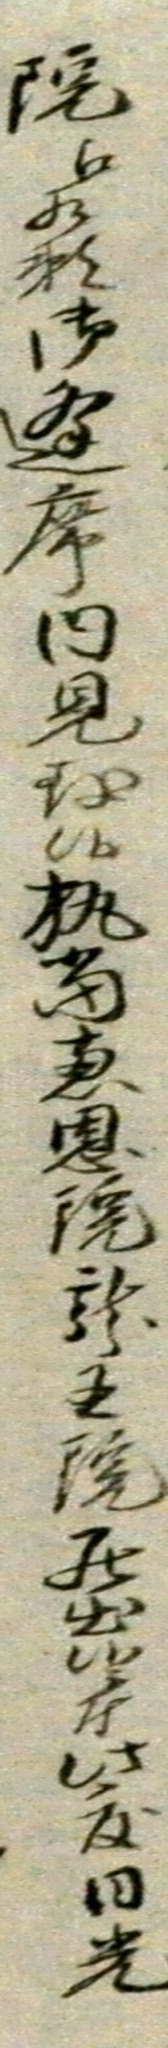院え相頼御逢席内見致候執当恵恩院龍王院罷出候ニ付此度日光
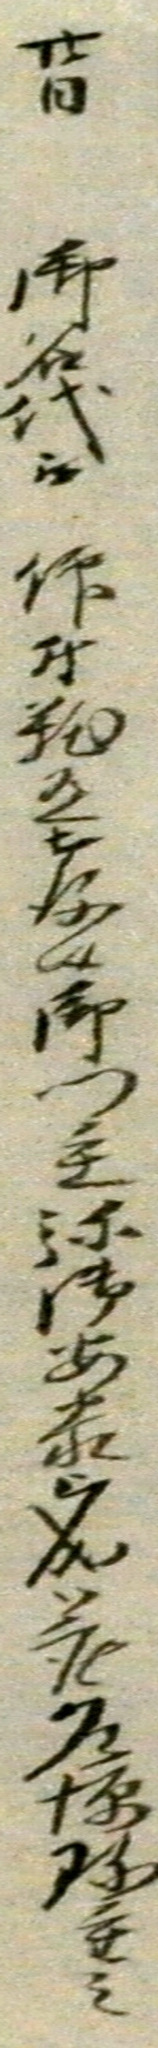廿日御名代被仰付難有奉存候御門主弥御安泰被成御座乍憚珎重之
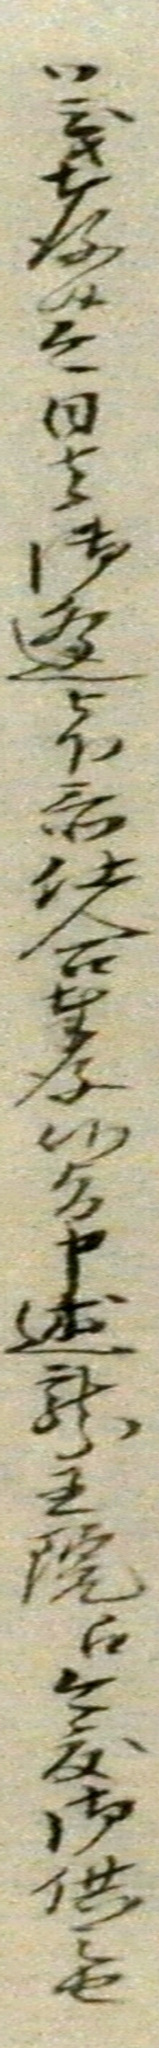御義奉存候今日は御逢被下忝仕合奉存候旨申述龍王院え今度御供之由
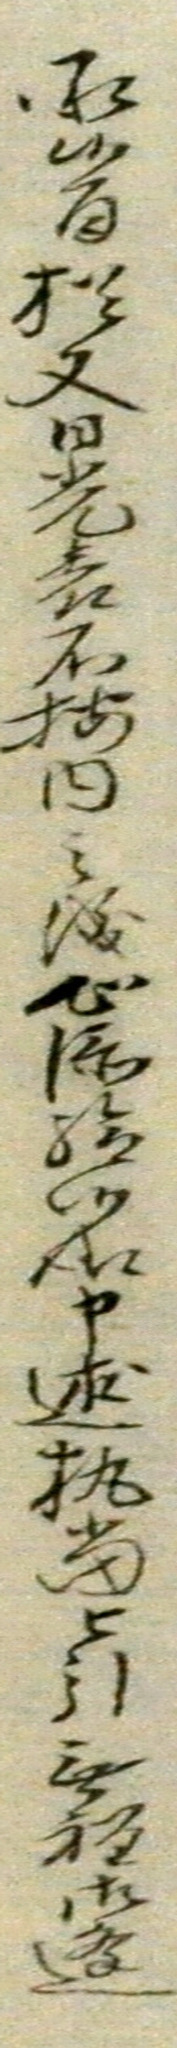承候間猶又日光表不按内之儀心添給候様申述執当被引無程御逢
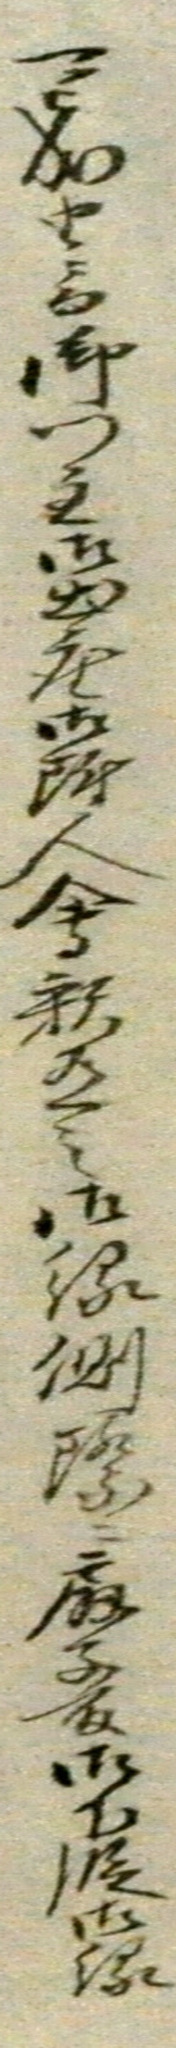可被成由ニ而御門主御出座御附人会釈有之御縁側際ニ扇子取御下段御縁
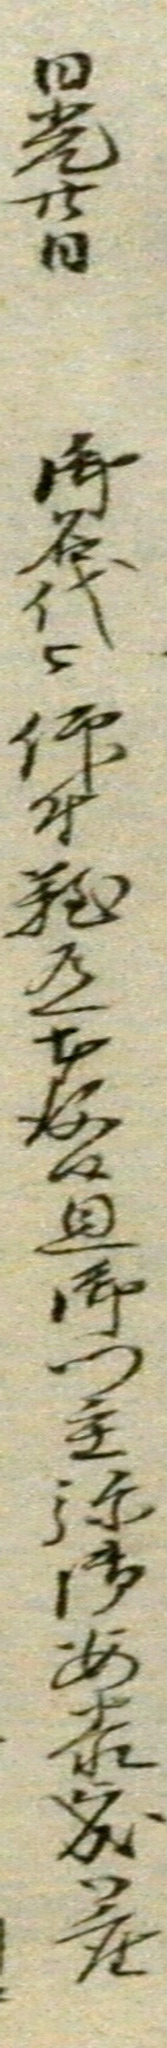日光廿日御名代被仰付難有奉存候且御門主弥御安泰被成御座
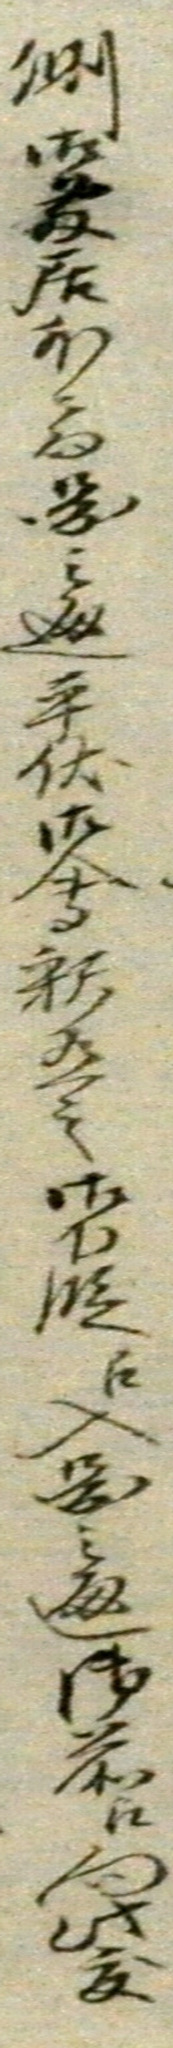側御敷居外ニ而図之通平服御会釈有之御下段え入図之通御前え向此度
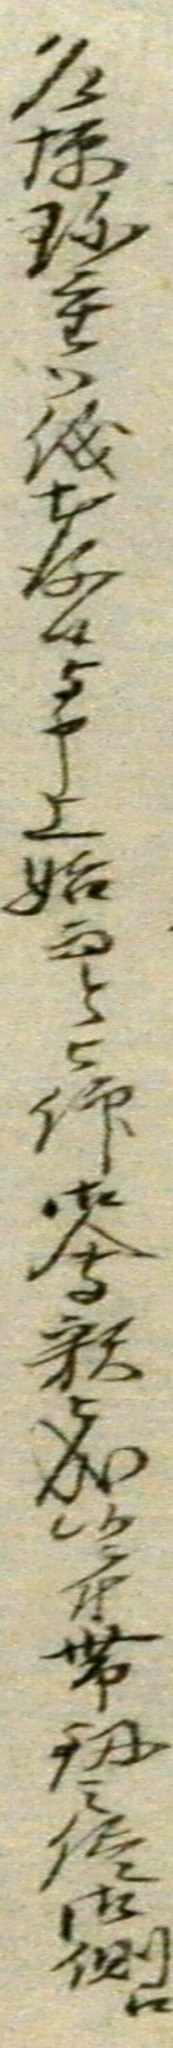乍憚珎重御儀奉存候と申上始而と被仰御会釈被成候ニ付帯剱之侭御側え
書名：諸留書〔一括〕
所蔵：伊那市立高遠町図書館・合同会社AMANE
